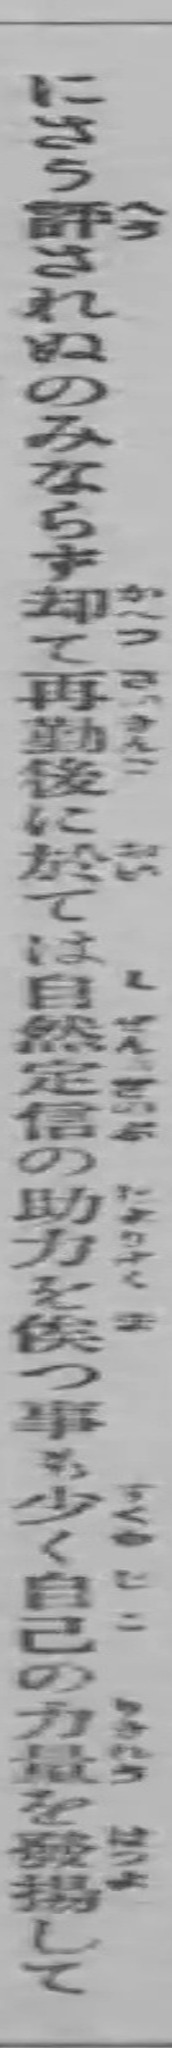にさう評されぬのみならず却て再勤後に於ては自然定信の助力を俟事も少く自己の力量を発揚して
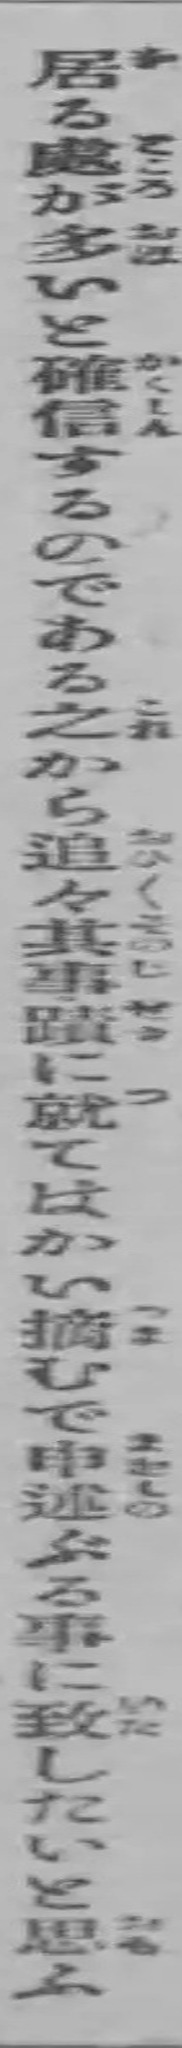居る処が多いと確信するのである之から追々其事蹟に就てはかい摘むで申述ぶる事に致したいと思ふ
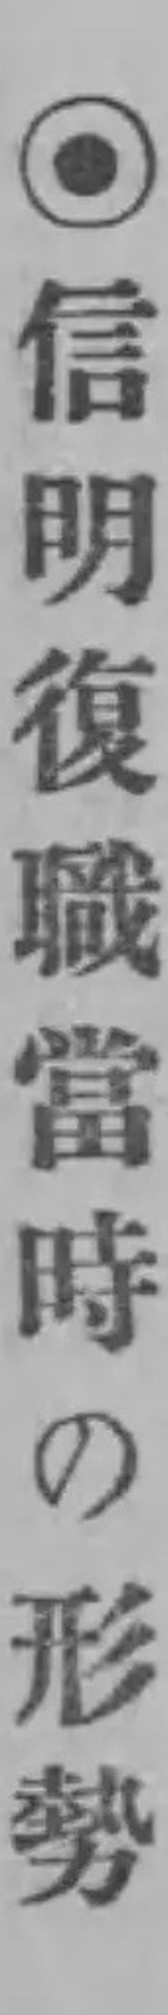⦿信明復職当時の形勢

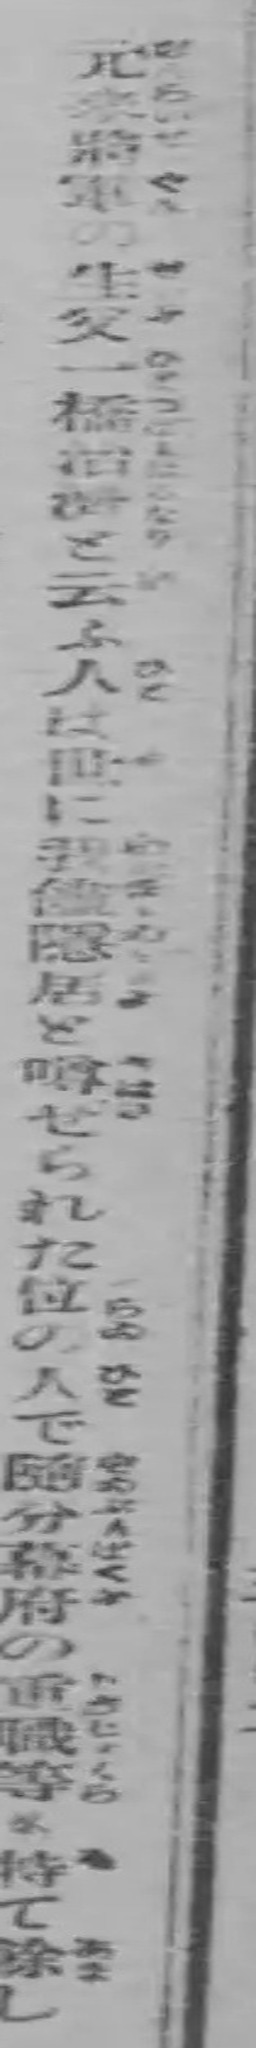我儘隠居元来将軍の生父一橋治済と云ふ人は世に我儘隠居と噂せられた位の人で随分幕府の重職等も持て余し
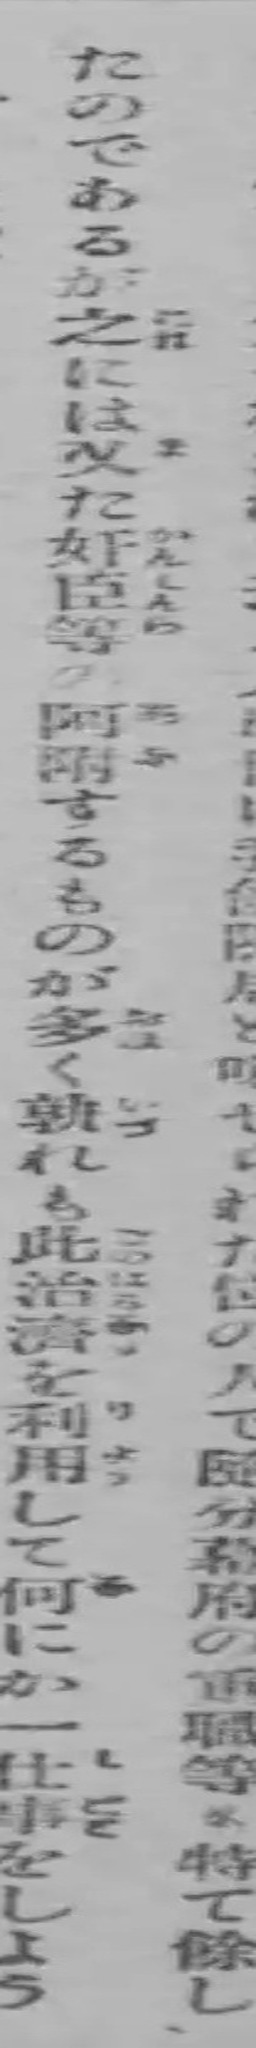たのであるが之には又た奸臣等の阿附するものが多く孰れも此治済を利用して何にか一仕事をしよう
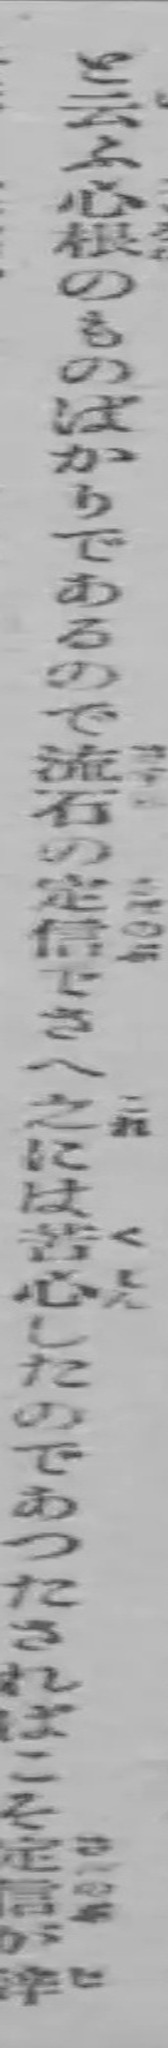と云ふ心根のものばかりであるので流石の定信でさへ之には苦心したのであつたさればこそ定信が辞
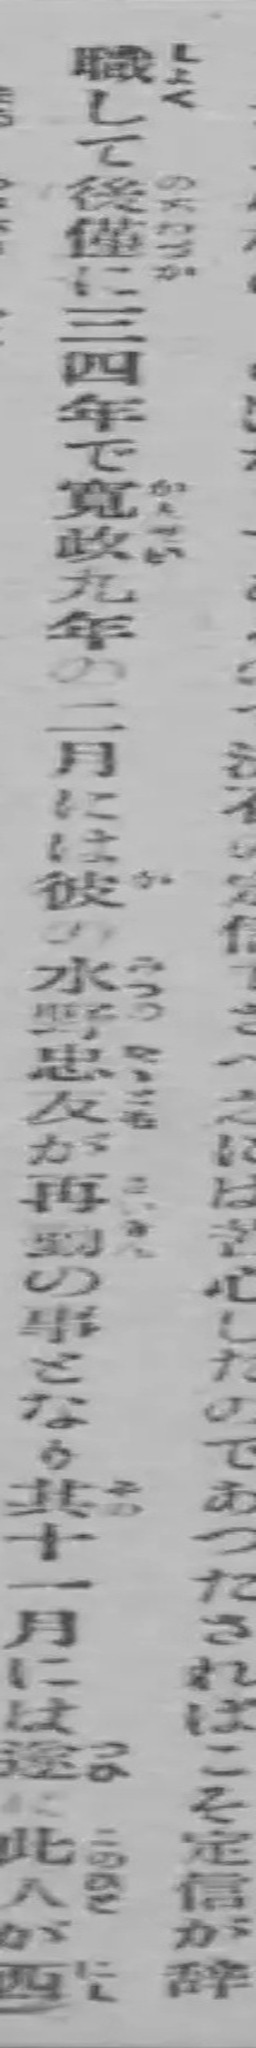水野忠友職して後僅に三四年で寛政九年の二月には彼の水野忠友が再勤の事となり其十一月には遂に此人が西
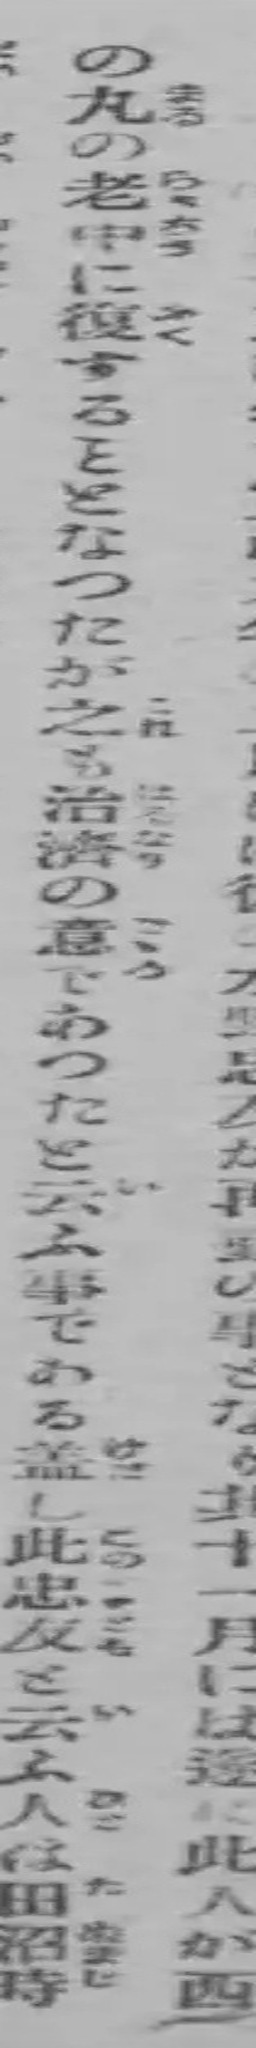の丸の老中に復することとなつたが之も治済の意であつたと云ふ事である蓋し此忠友と云ふ人は田沼時
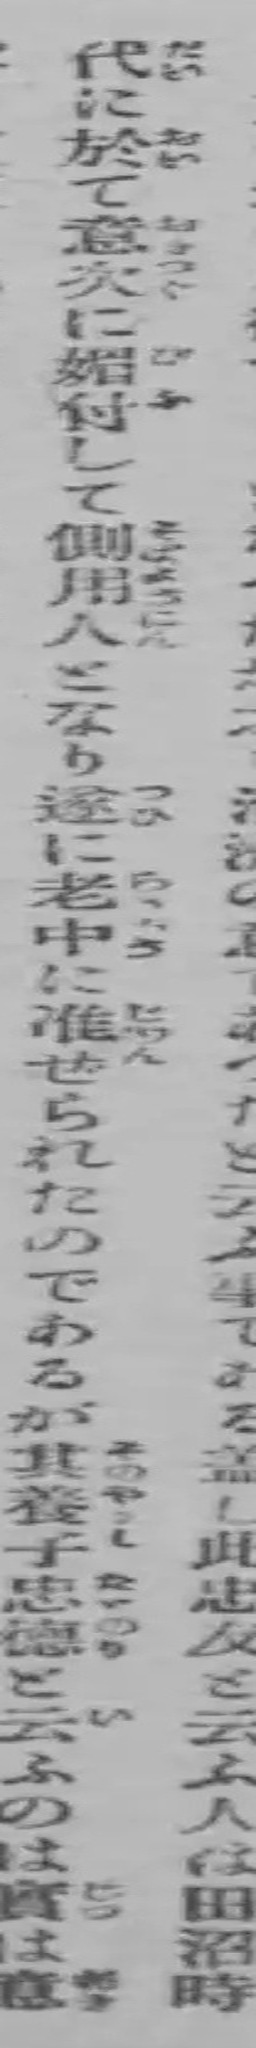代に於て意次に媚付して側用人となり遂に老中に准ぜられたのであるが其養子忠徳と云ふのは実は意
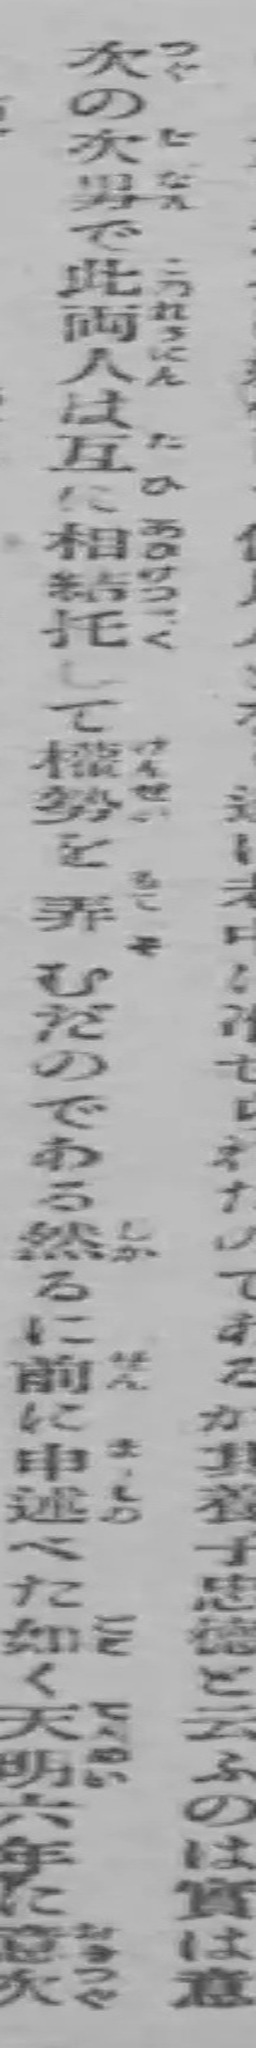次の次男で此両人は互に相結托して権勢を弄むだのである然るに前に申述べた如く天明六年に意次
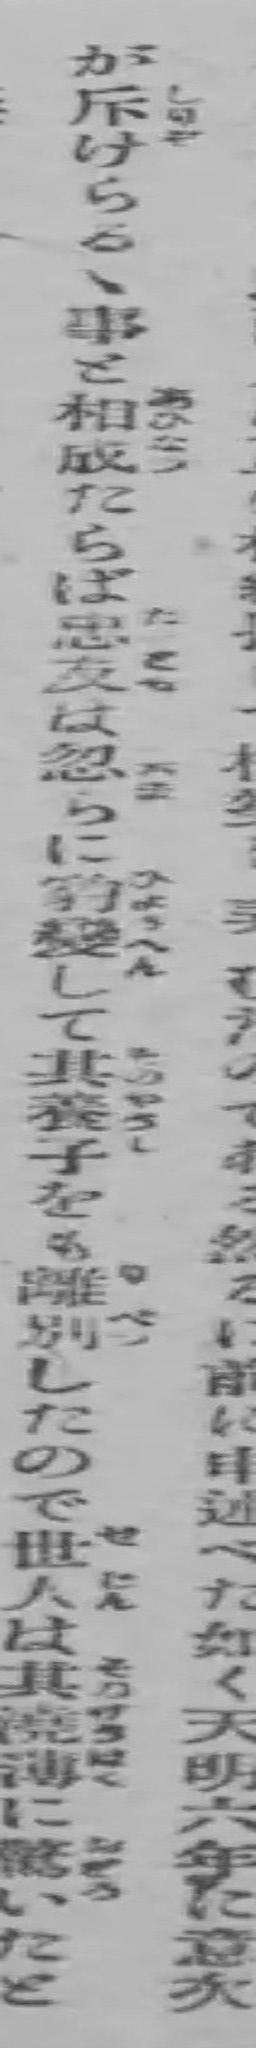が斥けらるゝ事と相成たらば忠友は忽ちに豹変して其養子をも離別したので世人は其澆薄に驚いたと
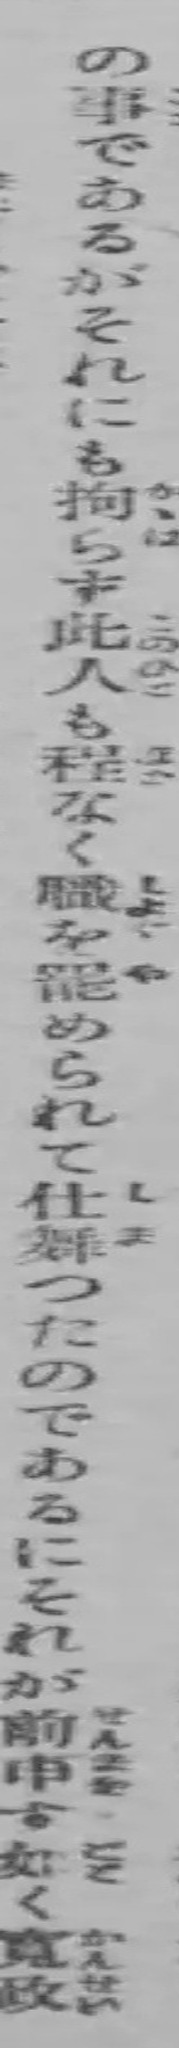の事であるがそれにも拘らず此人も程なく職を罷められて仕舞つたのであるにそれが前申す如く寛政
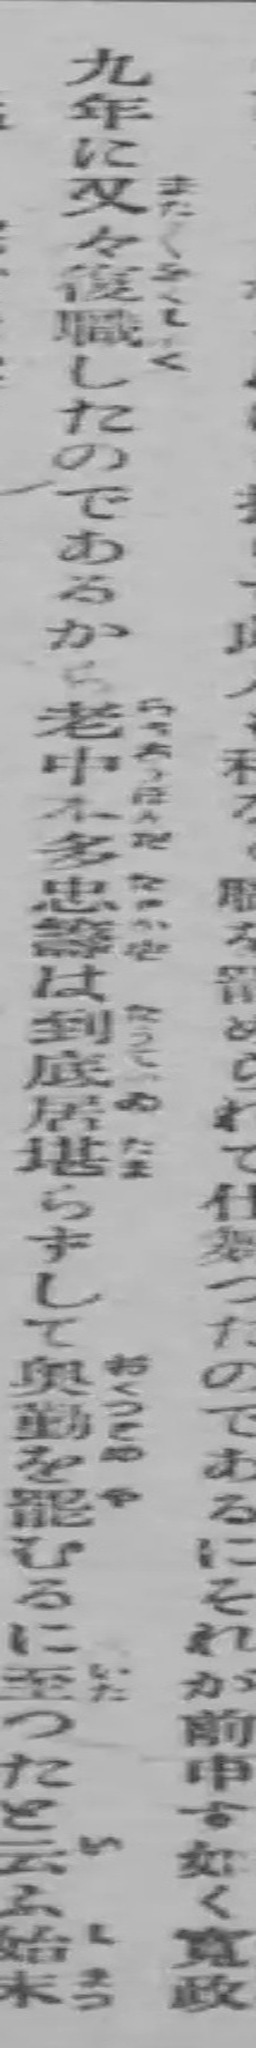九年に又々復職したのであるから老中本多忠籌は到底居堪らずして奥勤を罷むるに至つたと云ふ始末
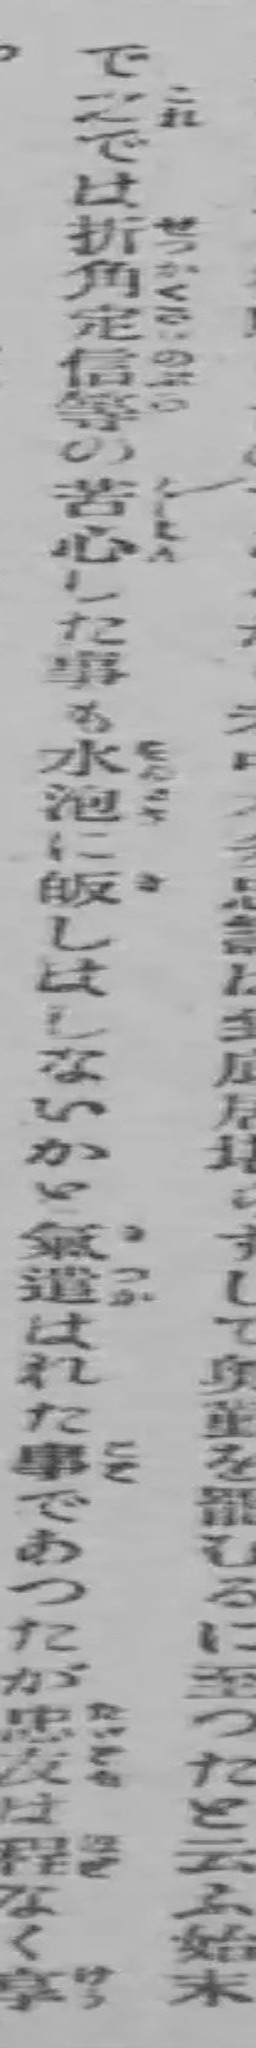で之では折角定信等の苦心した事も水泡に皈しはしないかと気遣はれた事であつたが忠友は程なく享
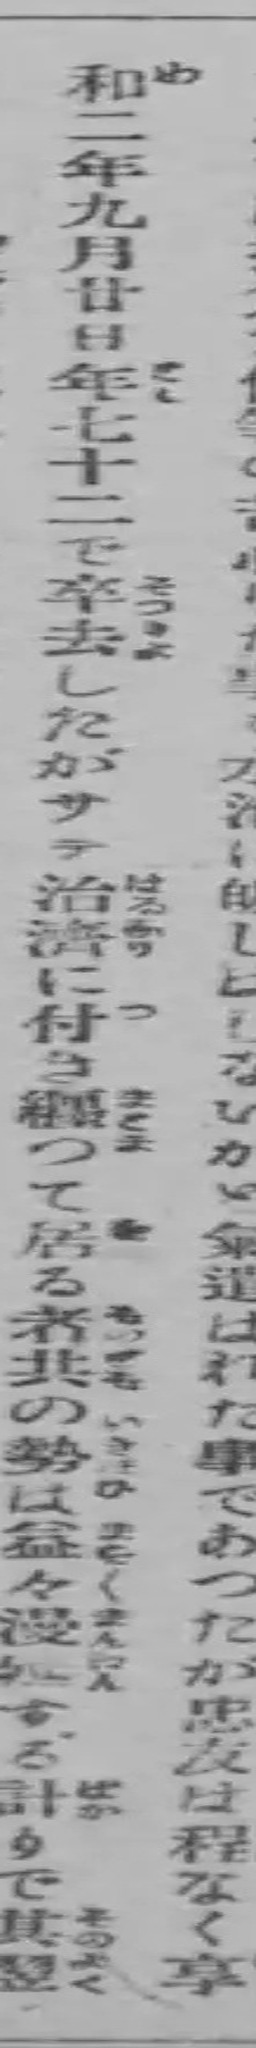和二年九月廿日年七十二で卒去したがサテ治済に付き纏つて居る者共の勢は益々漫延する計りで其翌
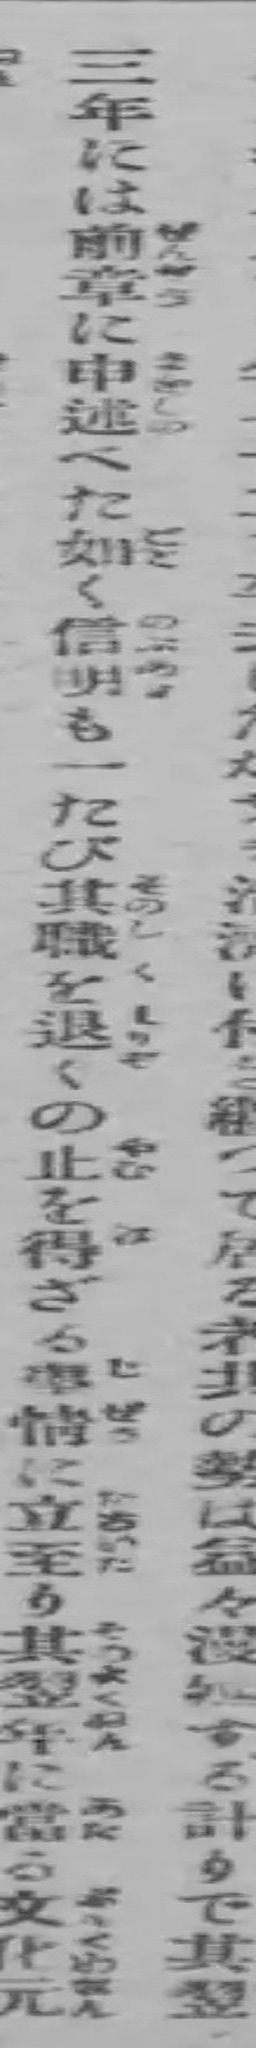三年には前章に申述べた如く信明も一たび其職を退くの止を得ざる事情に立至り其翌年に当る文化元
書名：豊橋市史談
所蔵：国立国会図書館 National Diet Library, JAPAN
